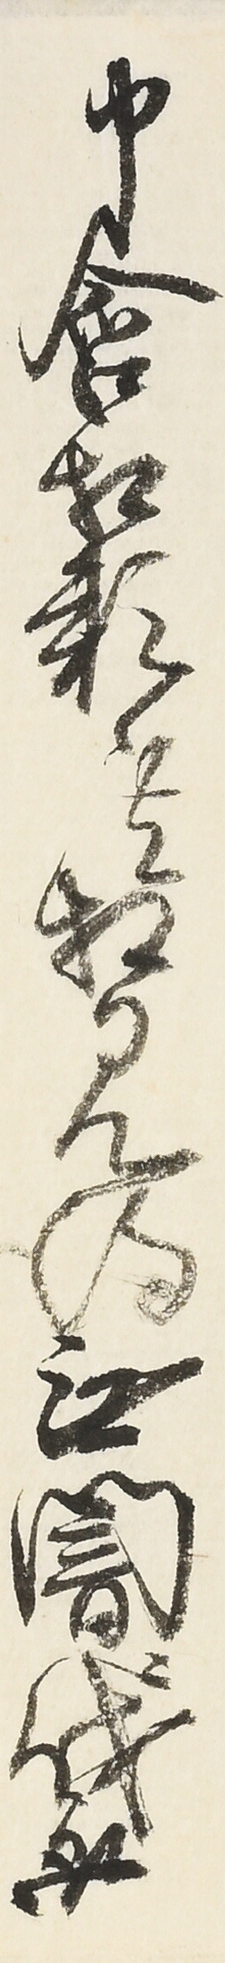申含相頼候与相見得無闇ニ伐取
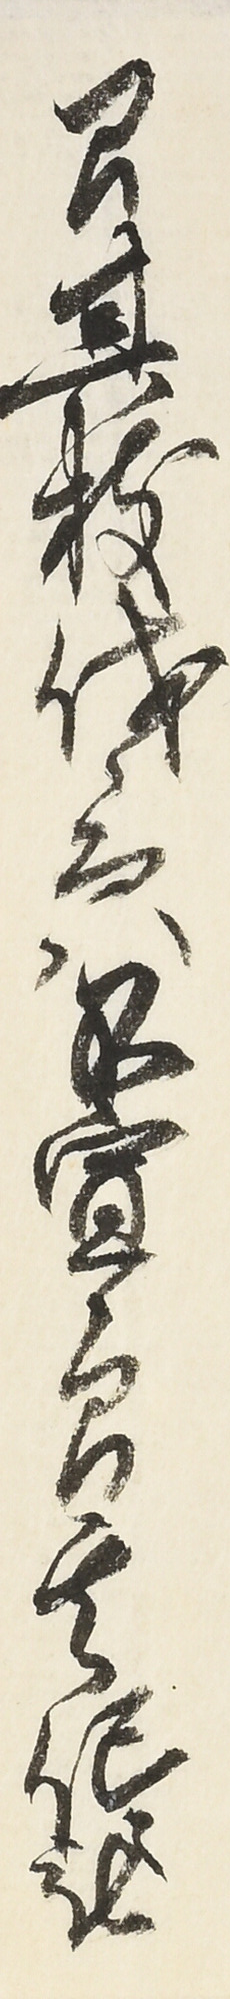間其枝伐候而ハ不宜候間其儘被
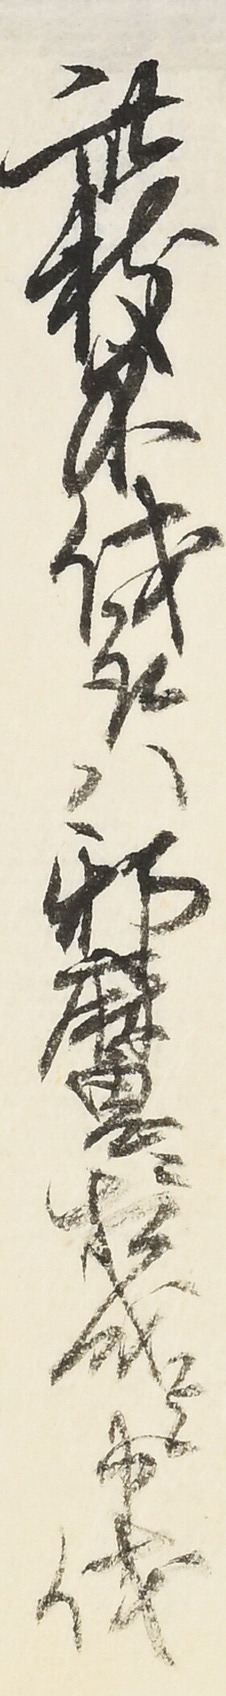此枝不伐取ハ邪魔ニ相成与申伐
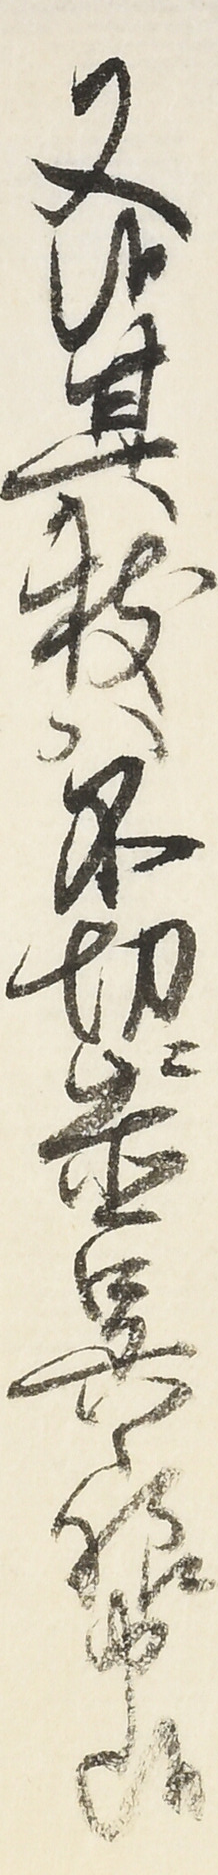又候其枝ハ不切ニ置呉六候様申候
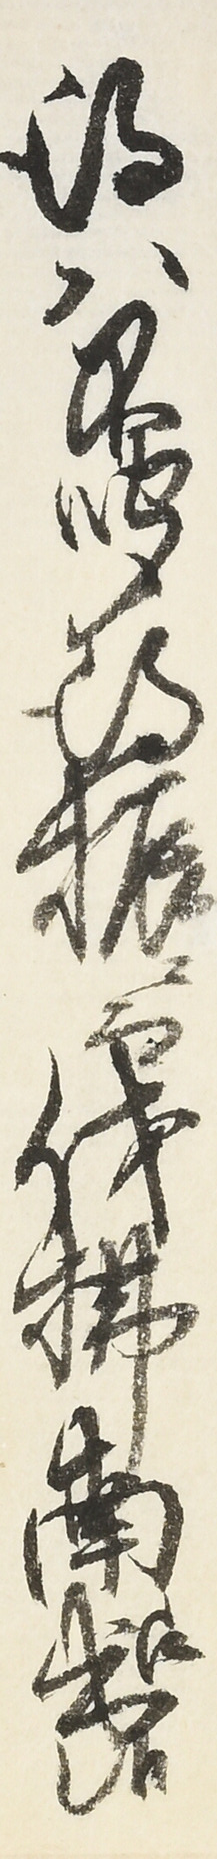得ハ不聞得振ニ而伐払南江出候
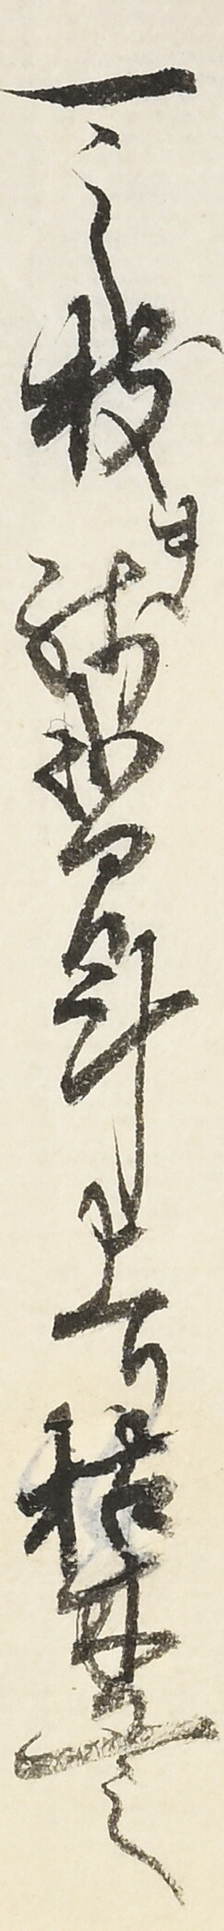一之枝ヲ残弐間斗上り枯木無之
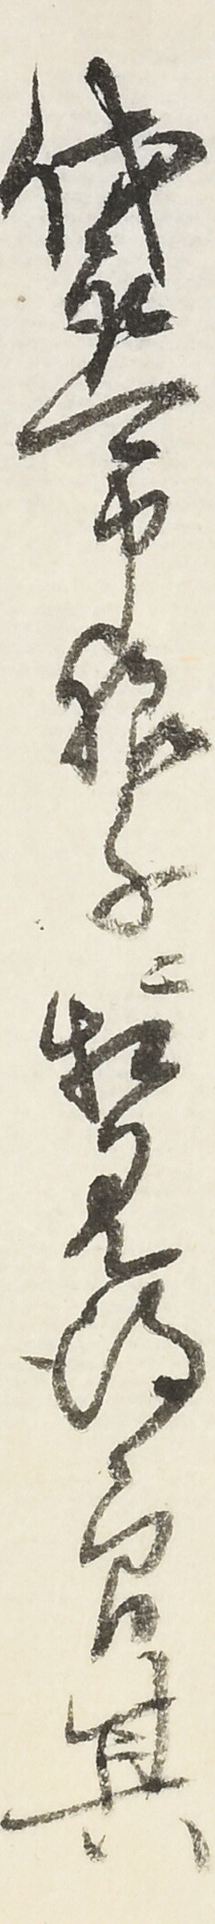伐取可申様子ニ相見得候間其
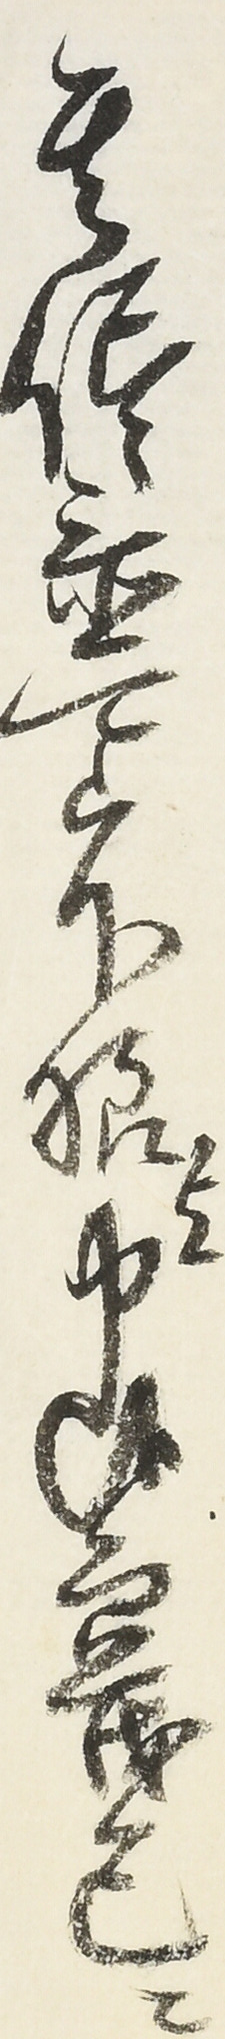其侭置可被下様与申候而茂己ニ
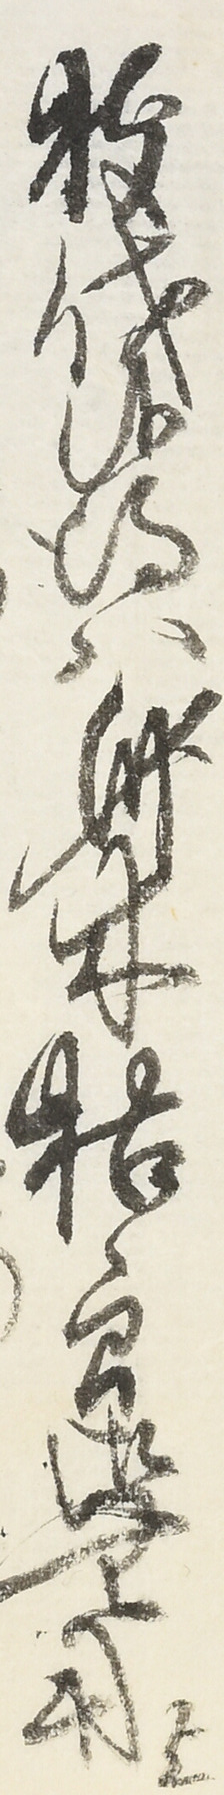枝伐候得ハ此木枯候間御無用与

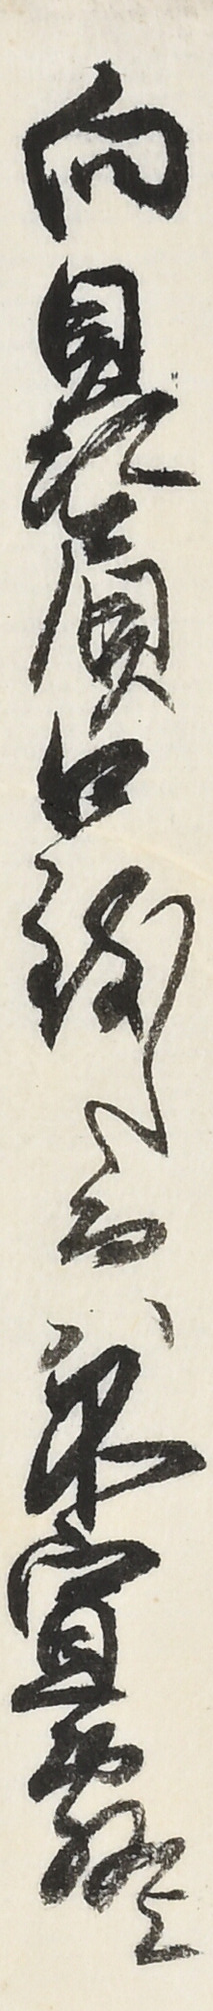向贔屓口致候而ハ不宜敷与
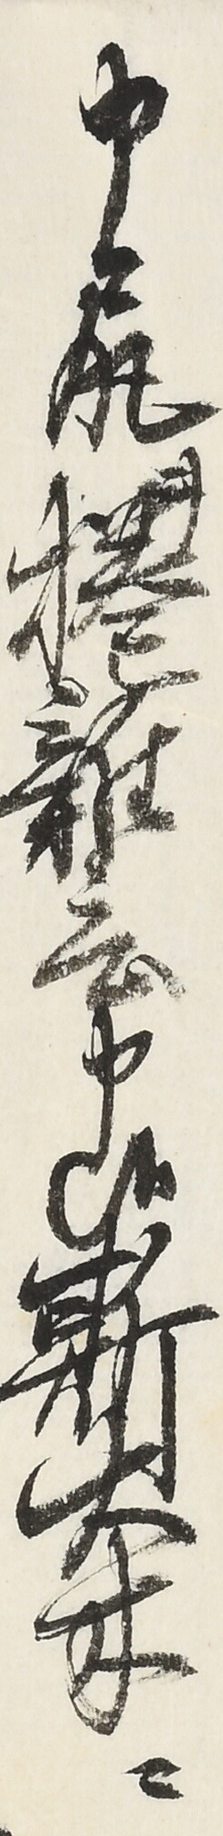申尻ヲ捲雑言申候斯大木ニ
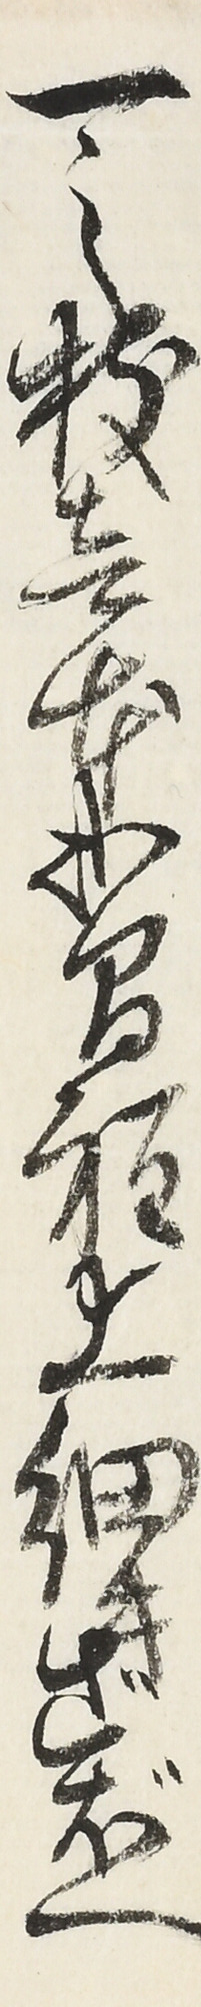一之枝壱本弐間程上細キさほへ
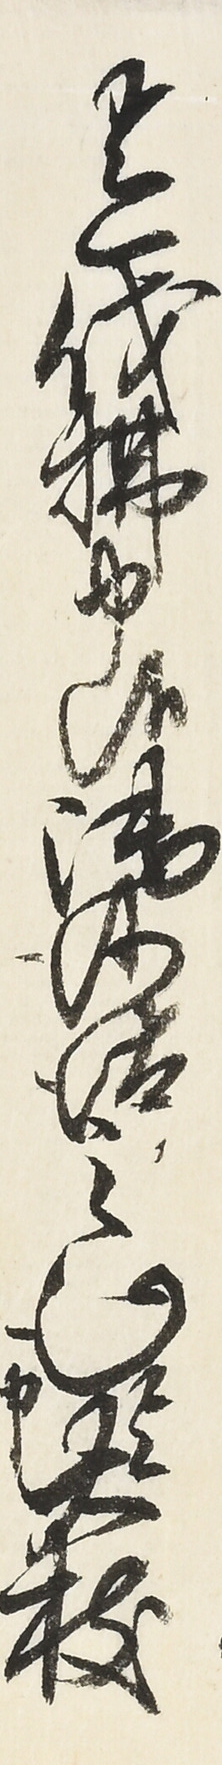迄伐払申候御沙汰之趣与申大枝
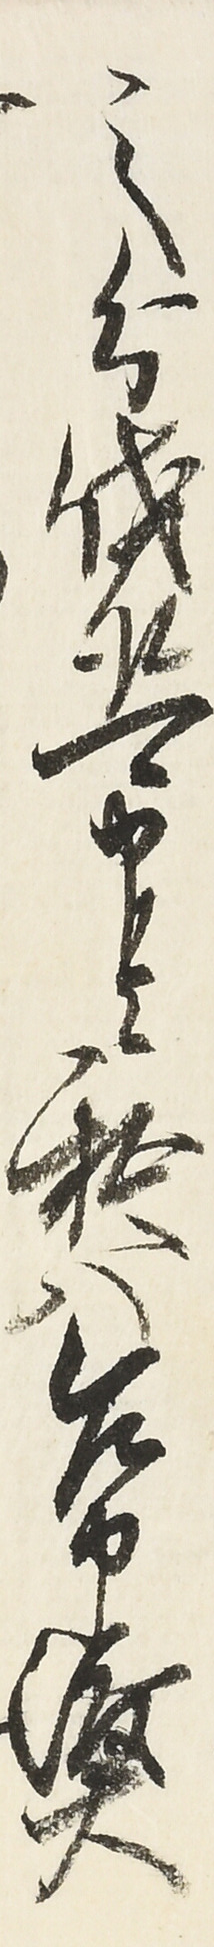之分伐取可申し与私へハ乍申渡大
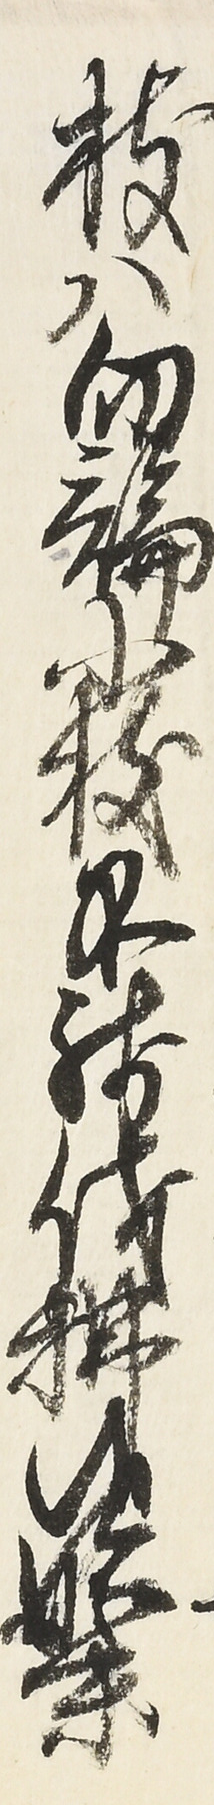枝ハ勿論小枝不残伐払候始末
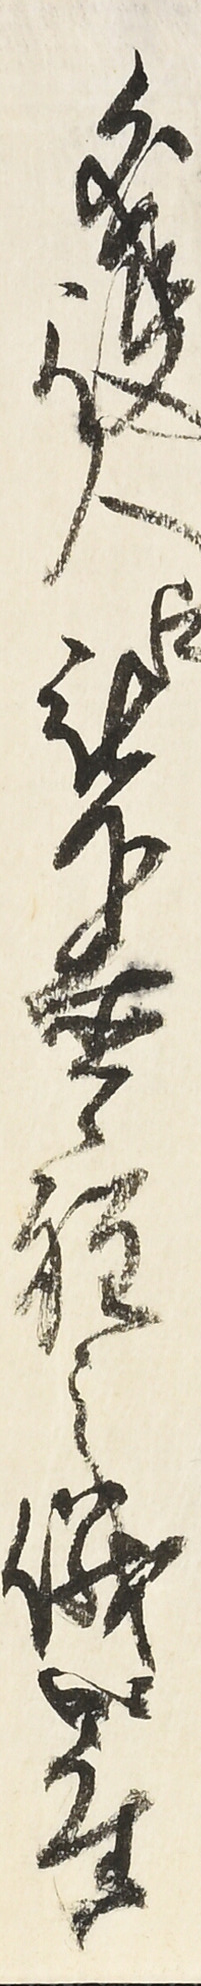義役人江被下置候程之儀ニ御座候
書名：乍恐御内々子委奉申上度口上書
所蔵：伊那市立高遠町図書館・合同会社AMANE
